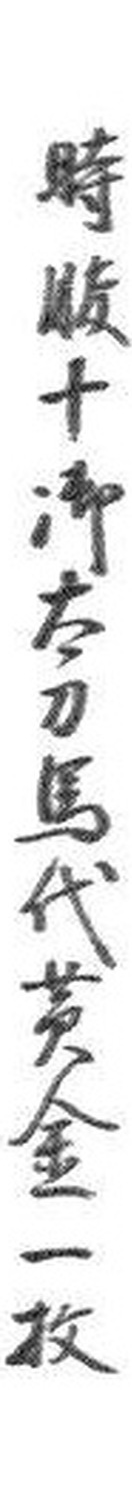時服十御太刀馬代黄金一枚
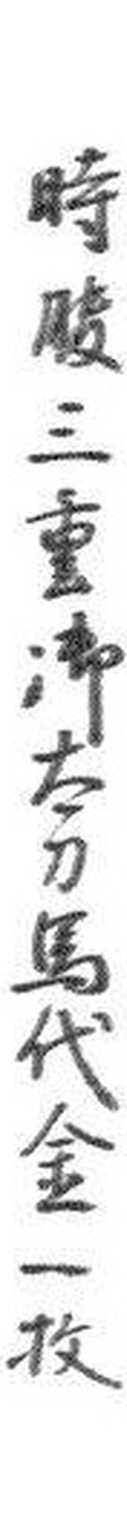時服三重御太刀馬代金一枚
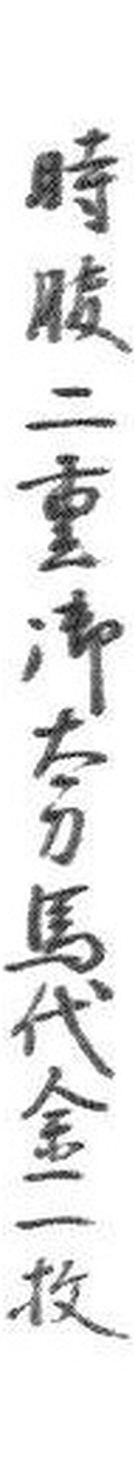時服二重御太刀馬代金一枚

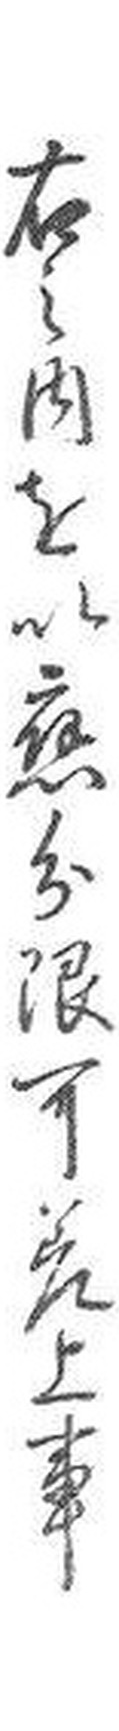右之内を以応分限可差上事
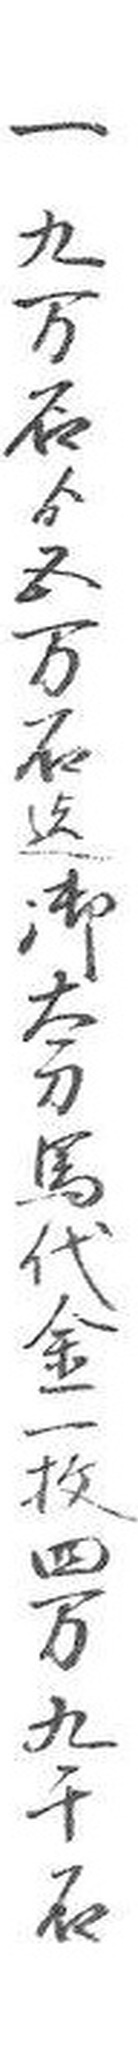一九万石ゟ五万石迄御太刀馬代金一枚四万九千石
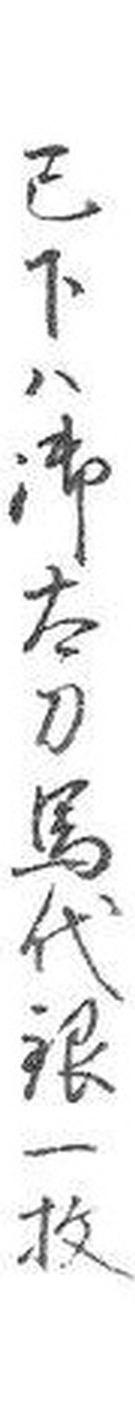已下ハ御太刀馬代銀一枚
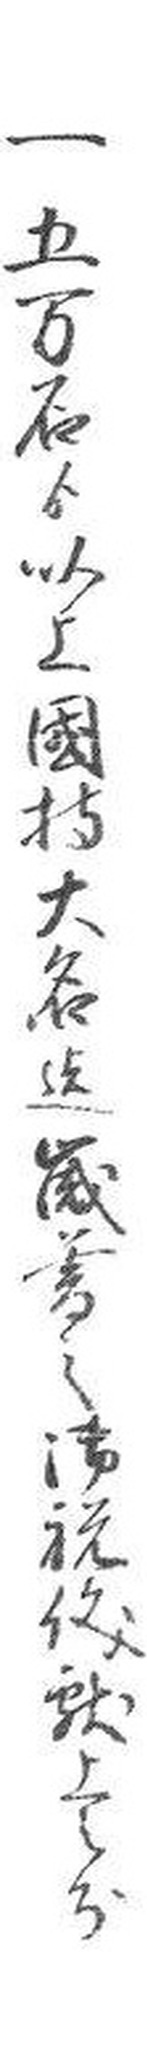一五万石ゟ以上国持大名迄歳暮之御祝儀献上之分
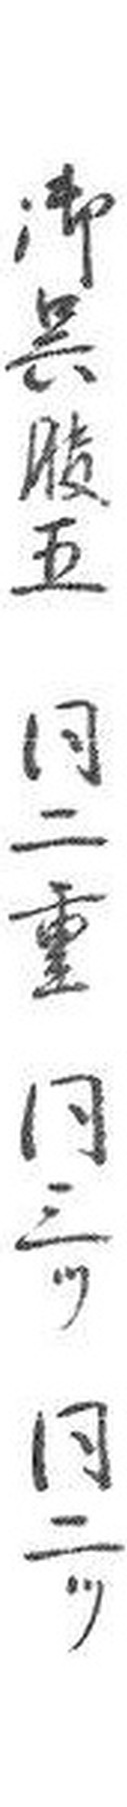御呉服五同二重同三ツ同二ツ
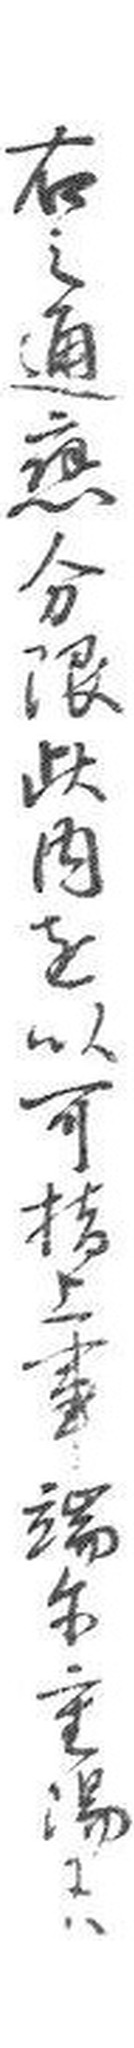右之通応分限此内を以可指上事端午重陽にハ
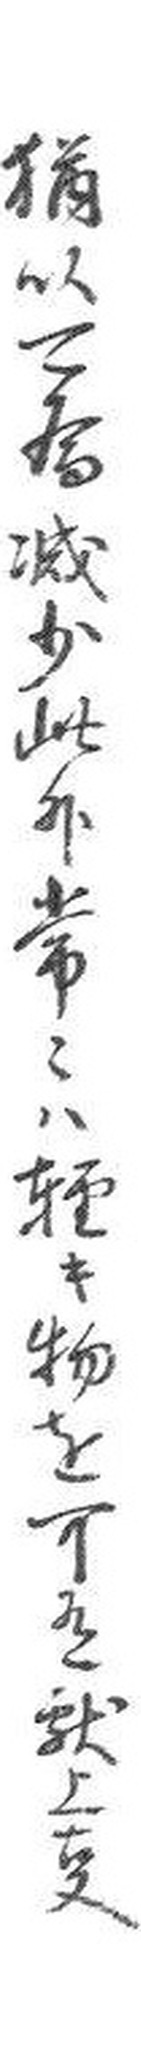猶以可為減少此外常々ハ軽キ物を可有献上事
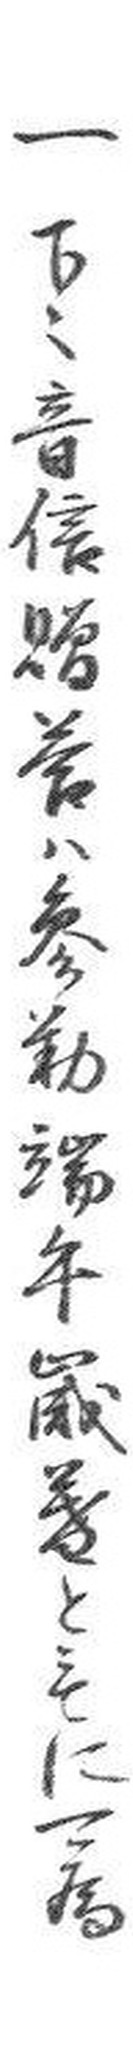一下々音信贈答ハ参勤端午歳暮ともに可為
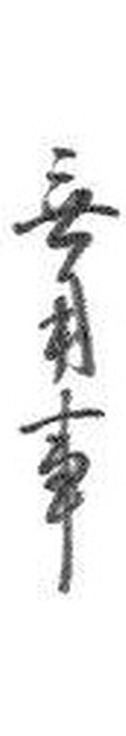無用事
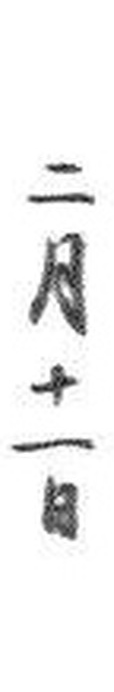二月十一日
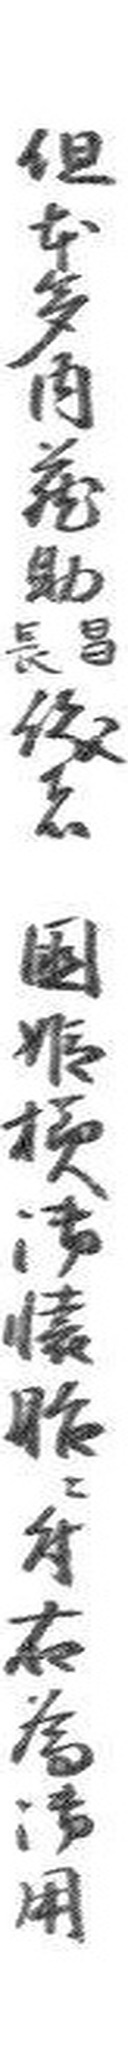但本多内蔵助昌長儀者国姫様御懐胎ニ付右為御用
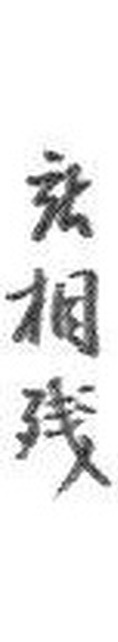被相残
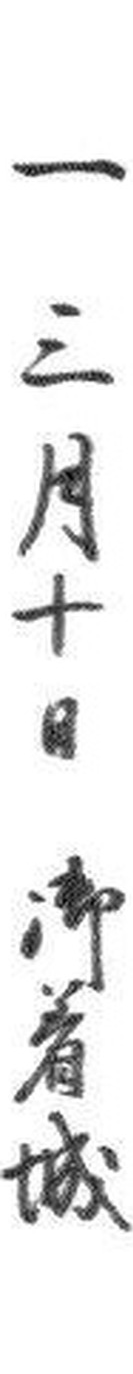一三月十日御着城
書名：家譜 五 光通公 従寛永十三年到万治二年
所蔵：福井県文書館 Fukui Prefectural Archives
